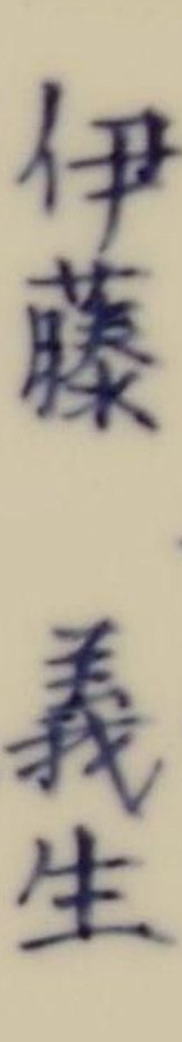伊藤義生
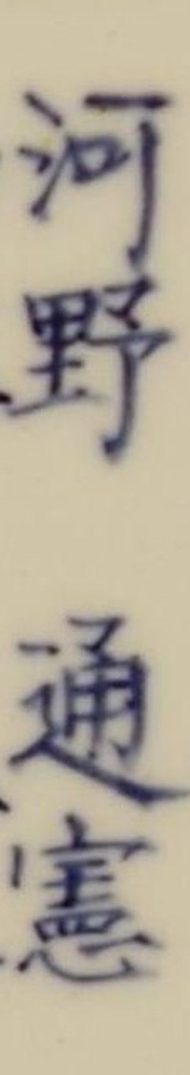河野通憲
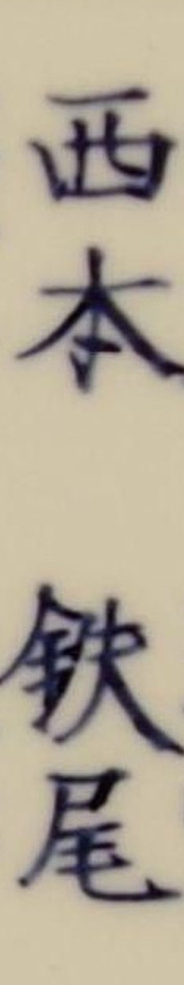西本鉄尾
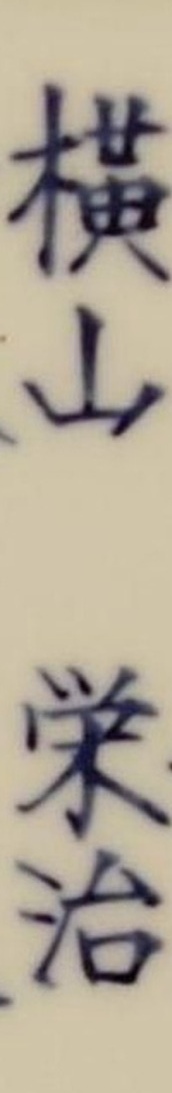横山栄治
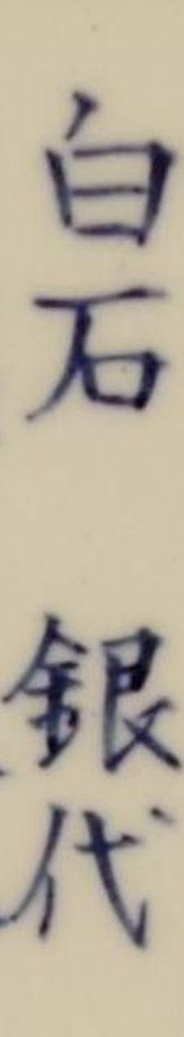白石銀代
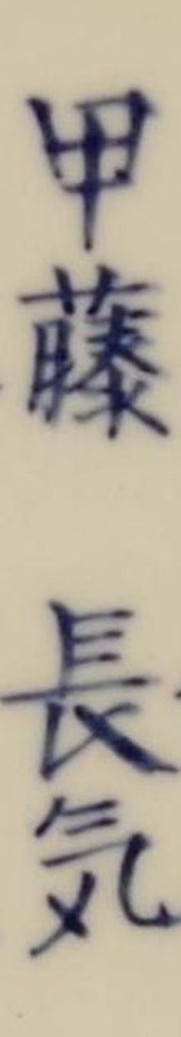甲藤長気
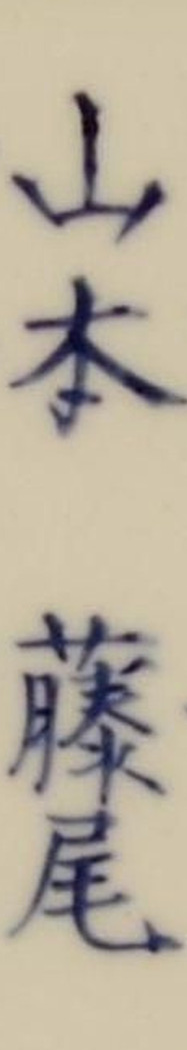山本藤尾
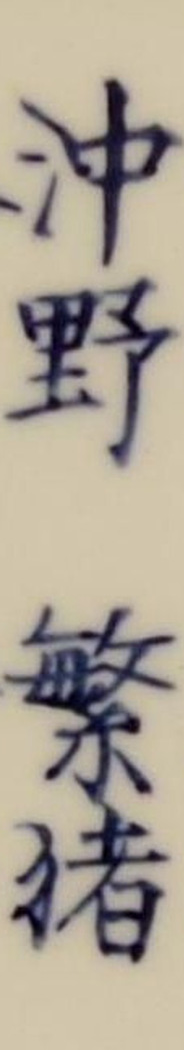沖野繁猪
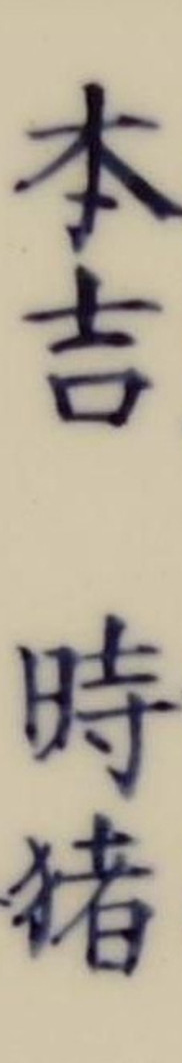本吉時緒
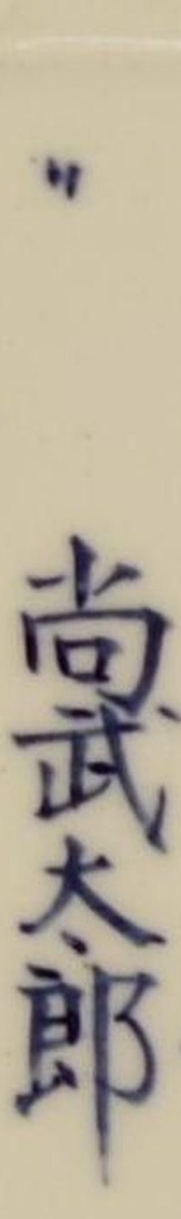尚武太郎
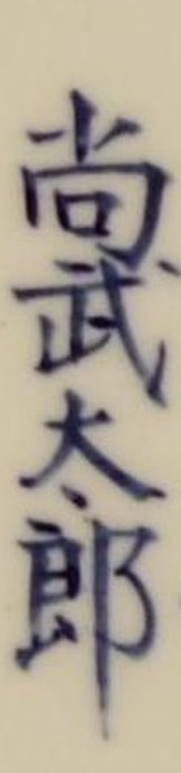尚武太郎
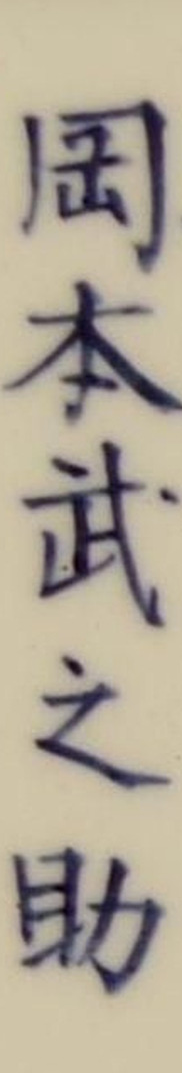岡本武之助
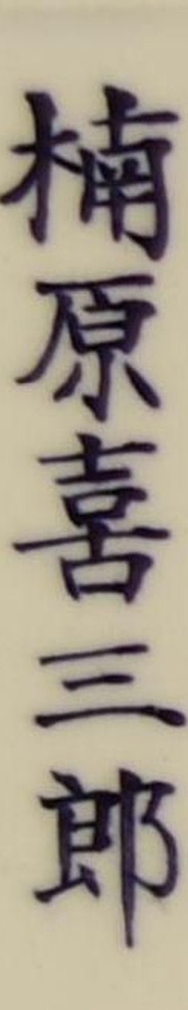楠原喜三郎

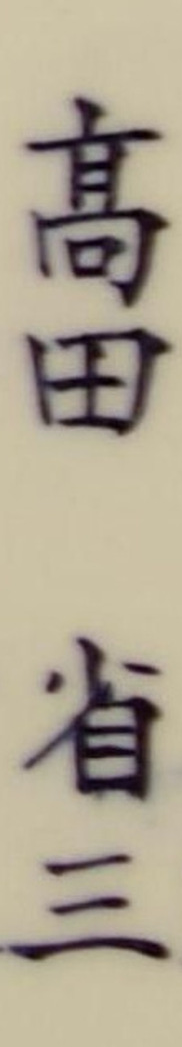高田省三
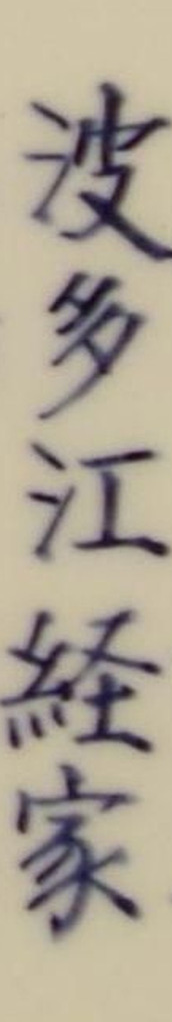波多江経家
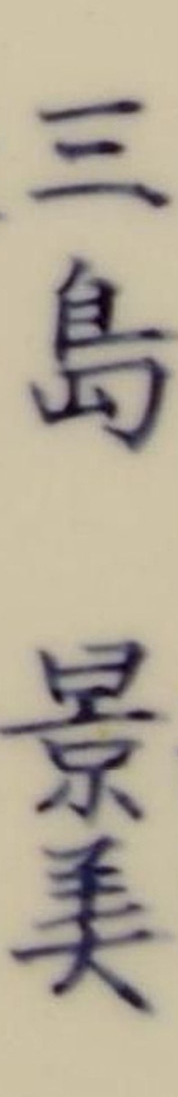三島景美
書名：E~L
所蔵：高野山金剛峯寺
